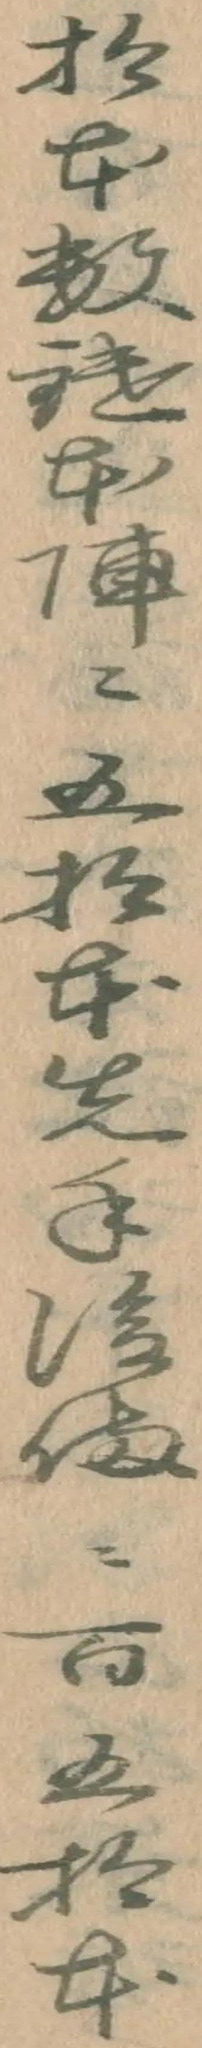拾本数鑓本陣に五拾本先手後備に百五拾本
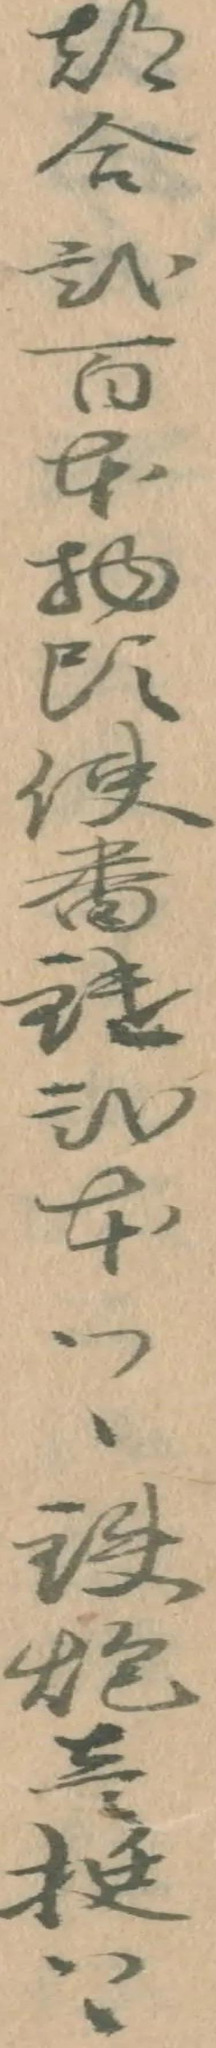都合弐百本物頭使番鑓弐本つゝ鉄炮壱挺つゝ

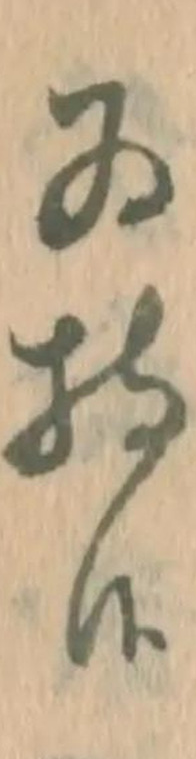ゐ持候
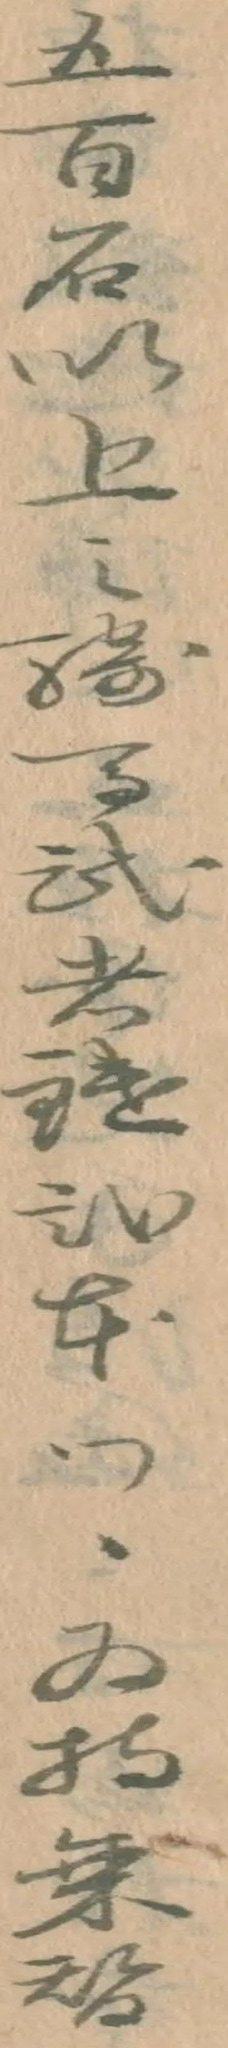五百石以上之騎馬武者鑓弐本つゝゐ持乗替
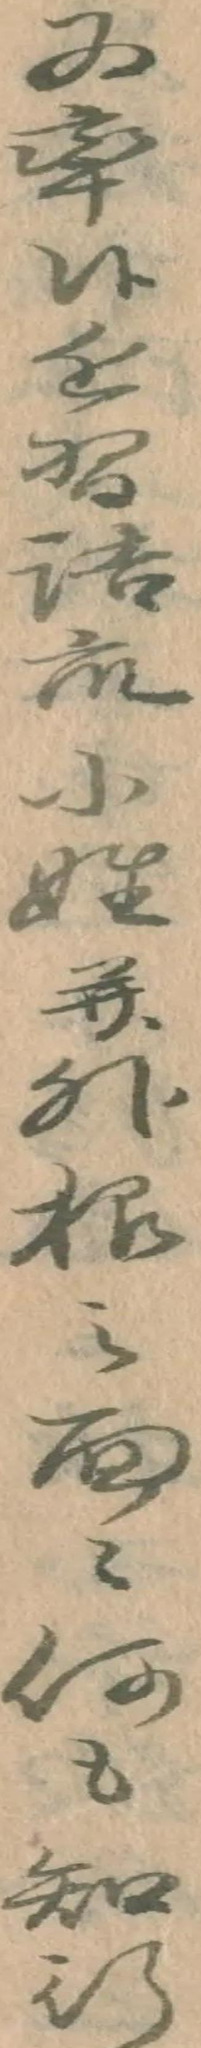ゐ率候近習詰衆小姓幷外様之面々何も知行
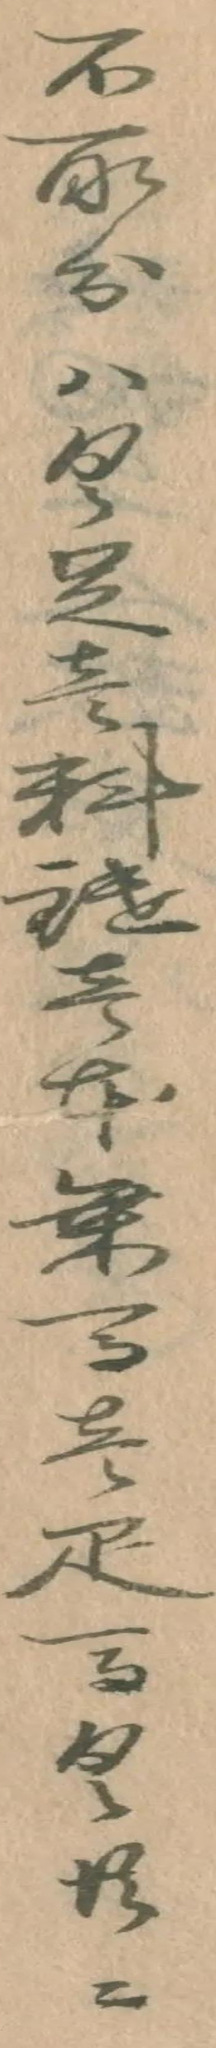石取分は具足壱料鑓壱本乗馬壱疋馬具共に
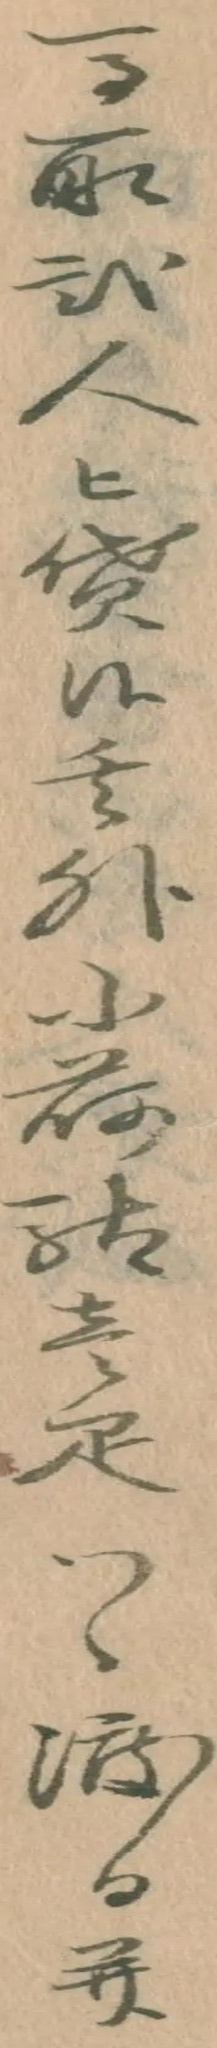馬取弐人被貸候其外小荷駄壱疋つゝ渡る幷
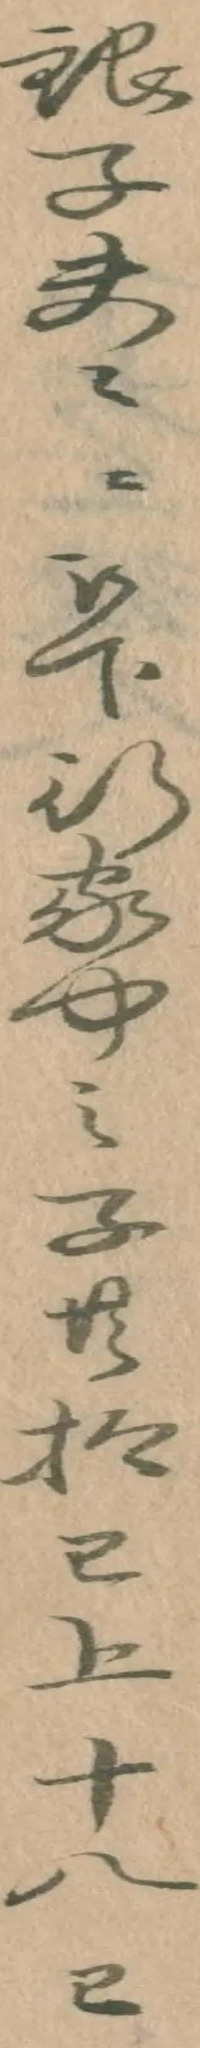銀子夫々に被下行家中之子共拾已上十八已
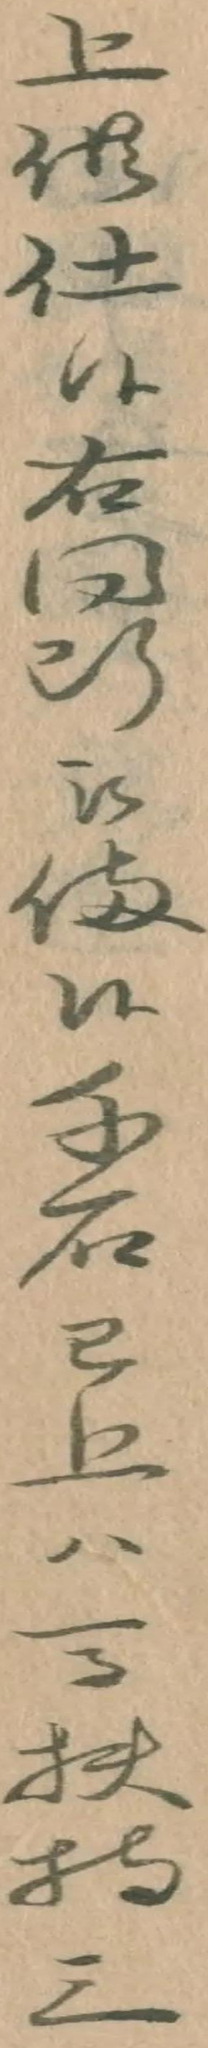上供仕候右同断被備候千石已上は馬扶持三
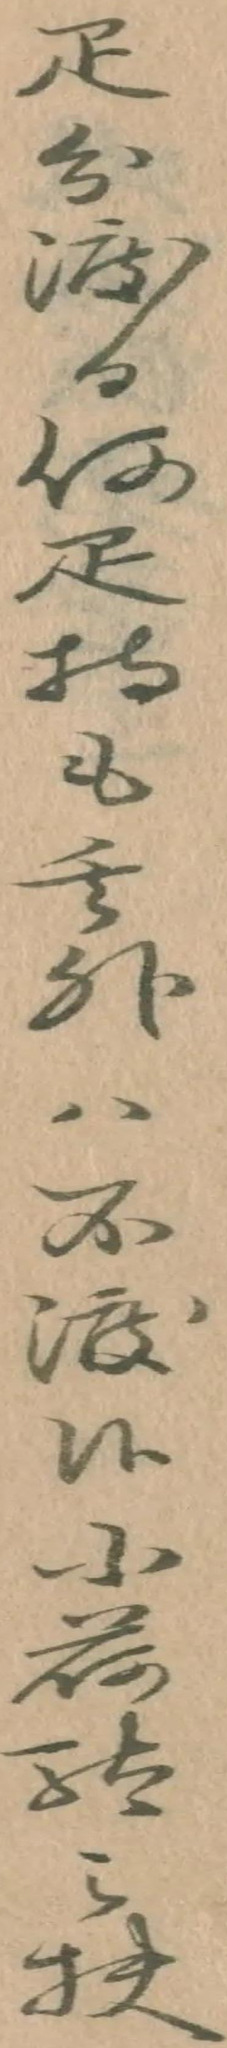疋分渡る何疋持も其外は不渡候小荷駄之扶
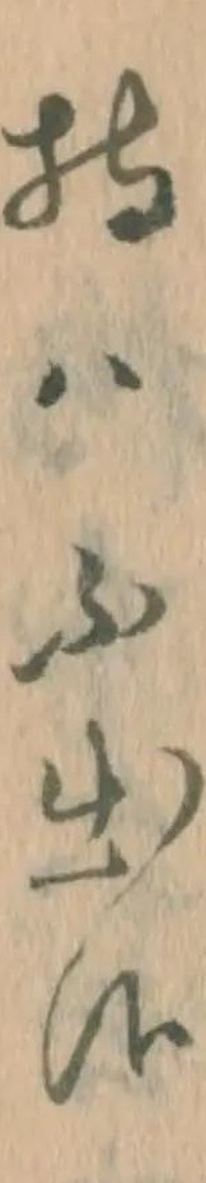持はふ出候
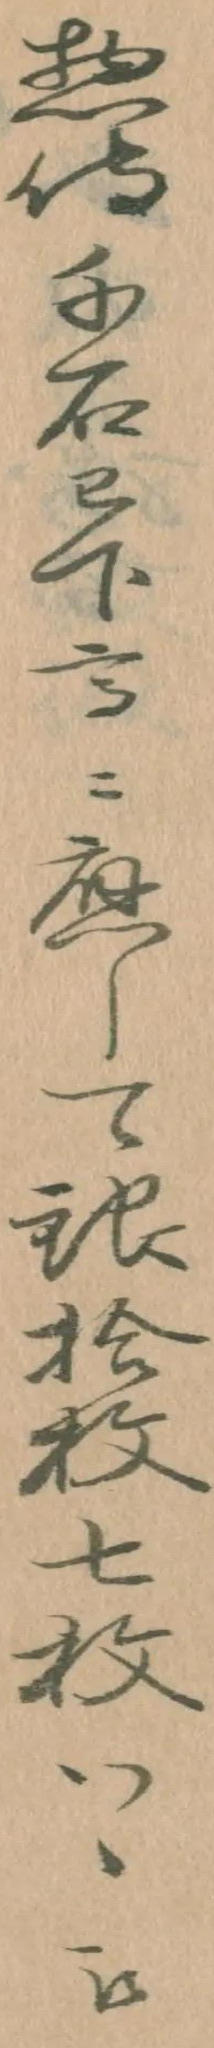惣侍千石已下高に応して銀拾枚七枚つゝ被
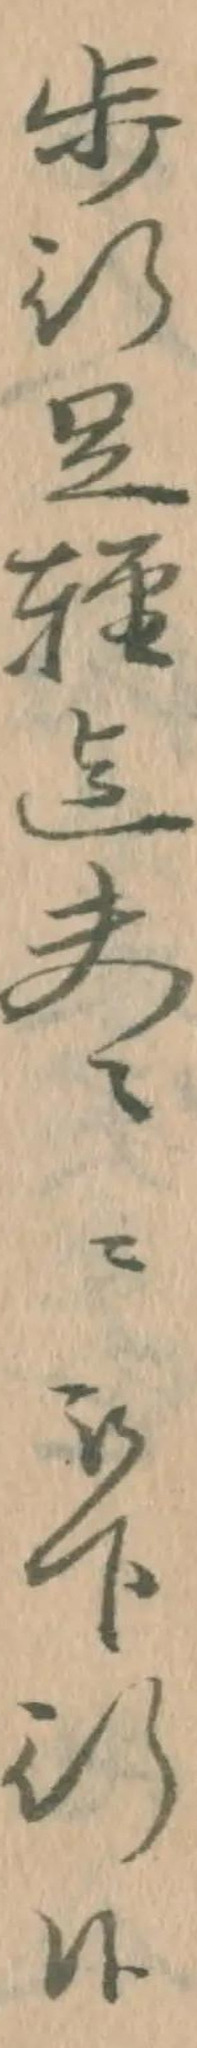歩行足軽迄夫々に被下行候
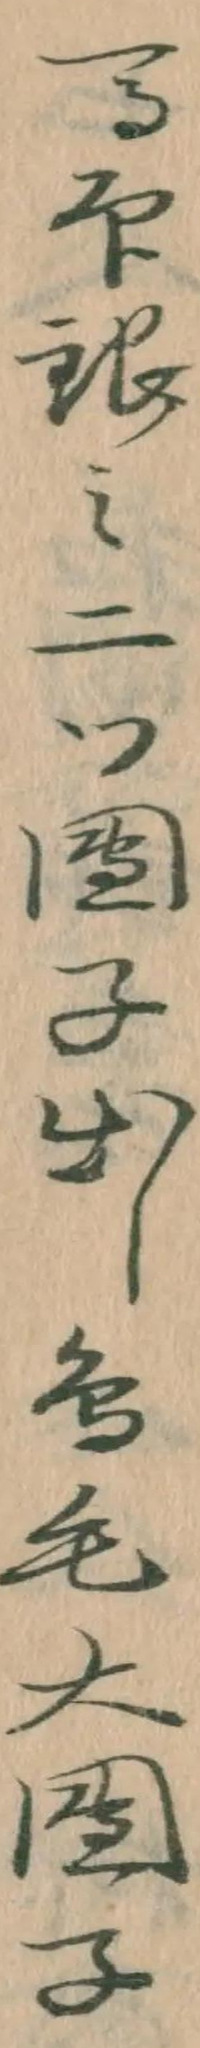馬印銀之二つ団子出し鳥毛大団子
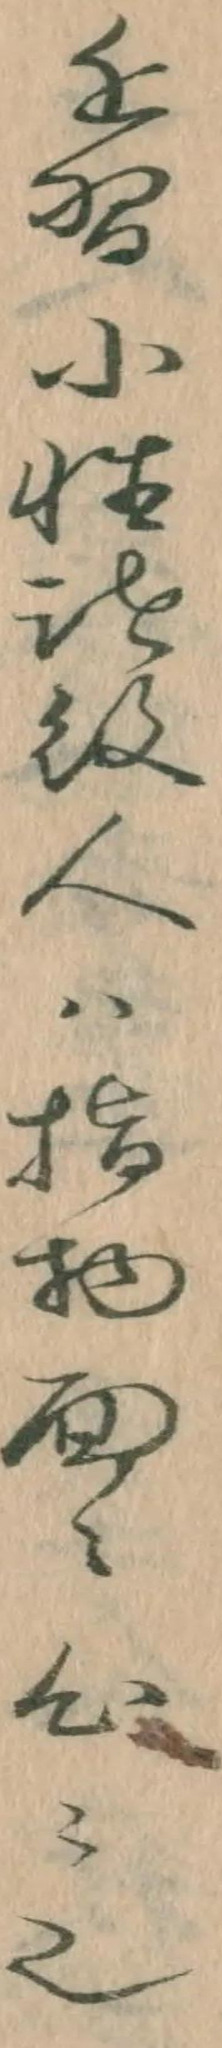近習小姓諸役人は指物面々心々也
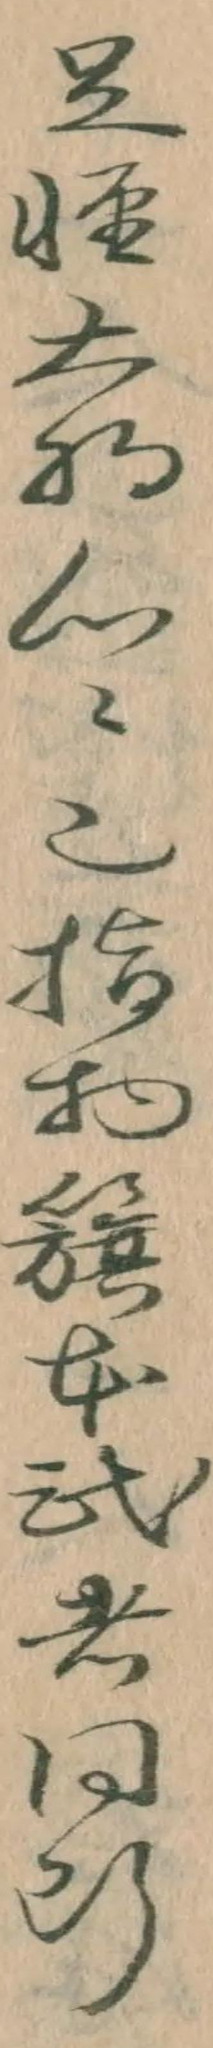足軽大将心々也指物籏本武者同断
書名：切支丹御退治記 49巻. [6]
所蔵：国立国会図書館 National Diet Library, JAPAN
